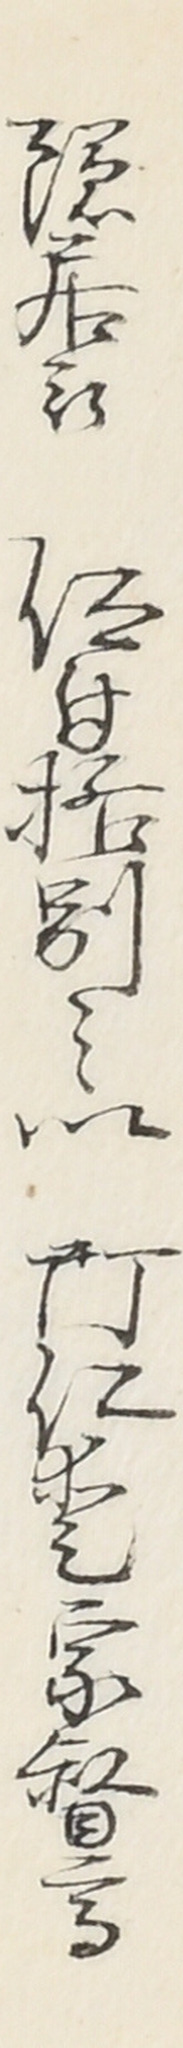隠居被仰付格別之以御仁愛家督高
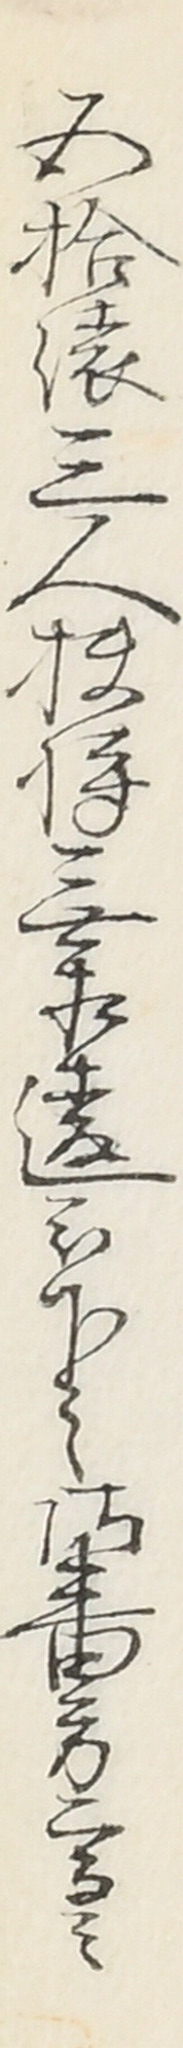五拾俵三人扶持無相違被下之御番方高之
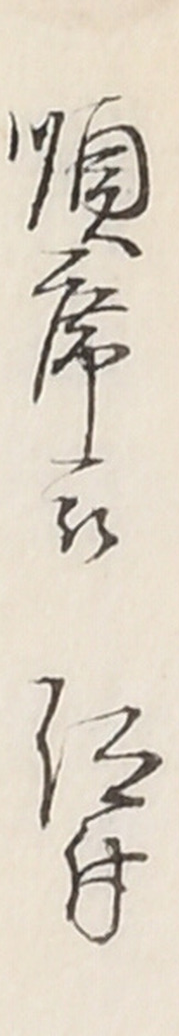順席被仰付
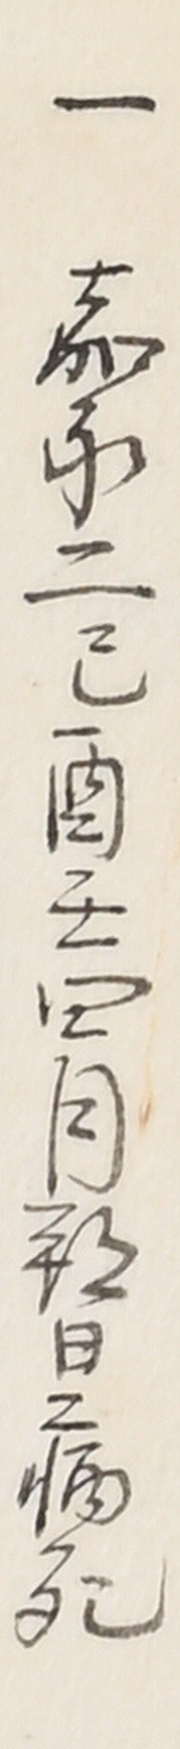一嘉永二己酉閏四月朔日病死
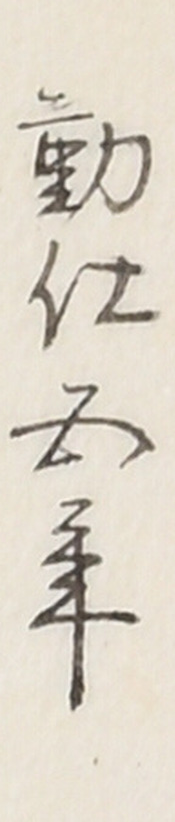勤仕五年
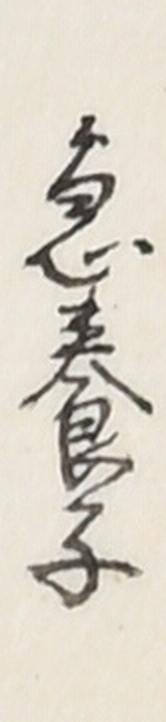急養子
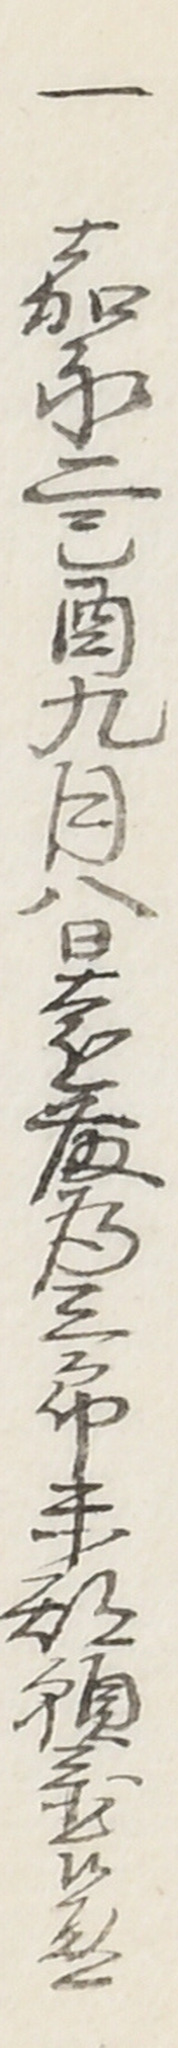一嘉永二己巳九月八日遠藤為三郎末期願置候通
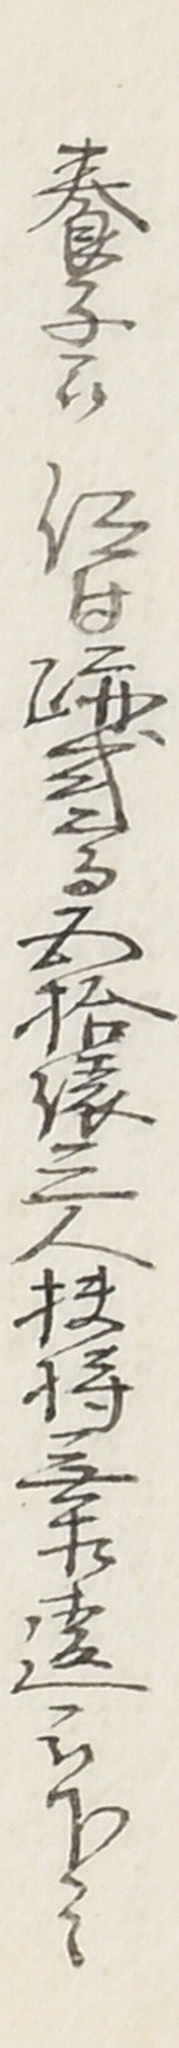養子被仰付跡式高五拾俵三人扶持無相違被下之
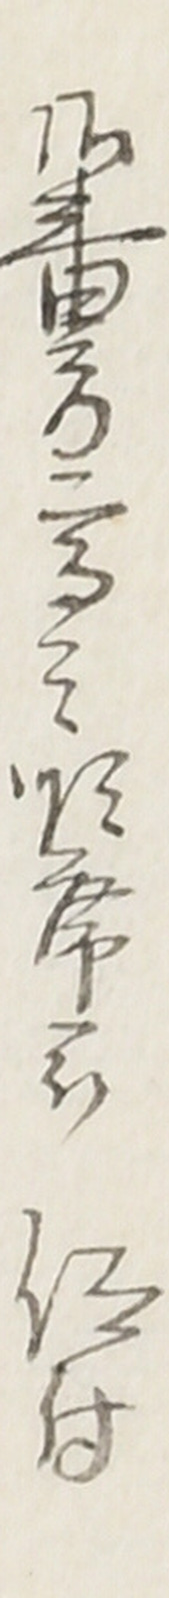御番方高之順被仰付
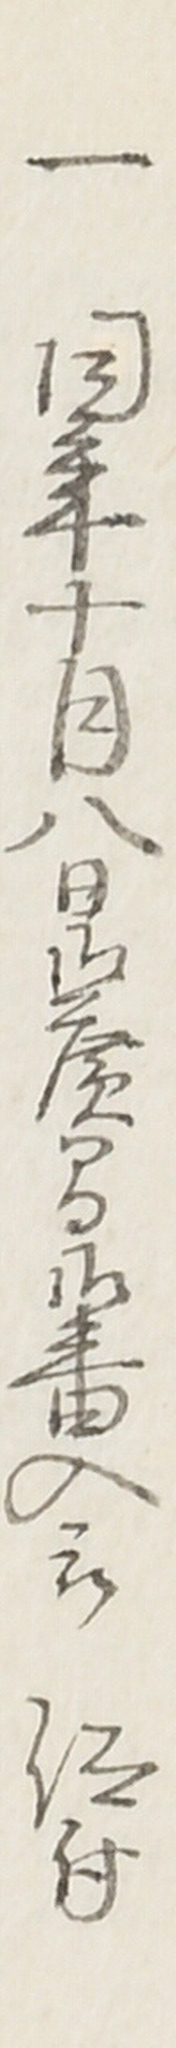一同年十月八日御広間御番入被仰付
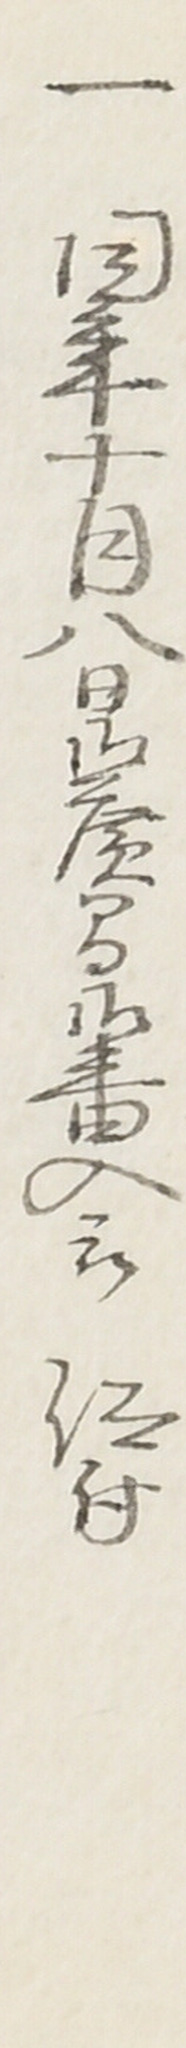一同年十月八日御広間御番入被仰付
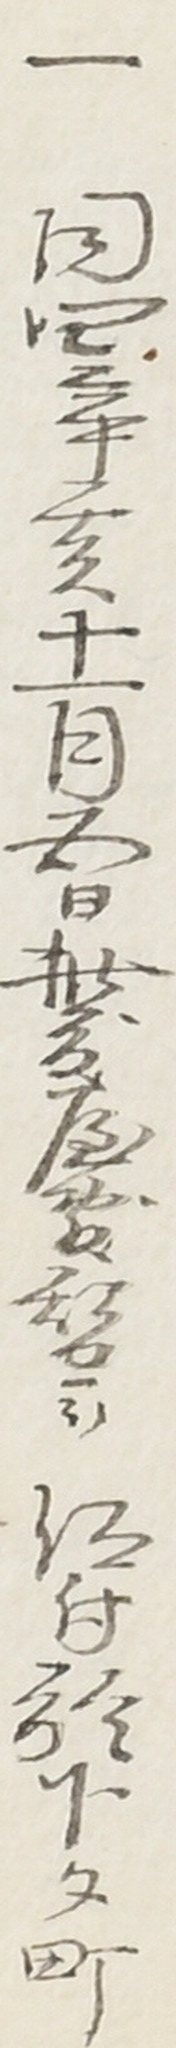一同四辛亥十一月五日此度屋敷替被仰付於下タ町
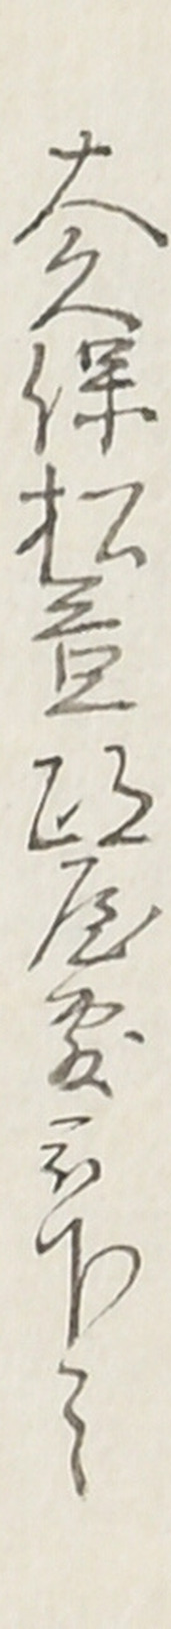大久保松壱跡屋敷被下之
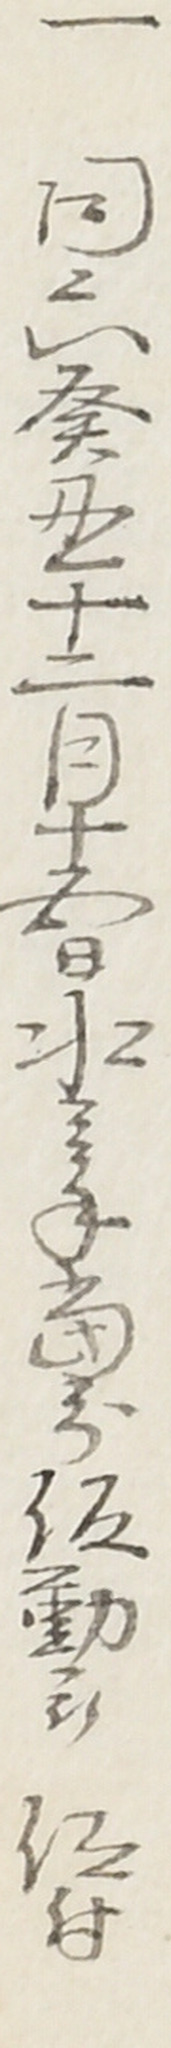一同六癸丑十二月十五日水之手当分仮勤被仰付

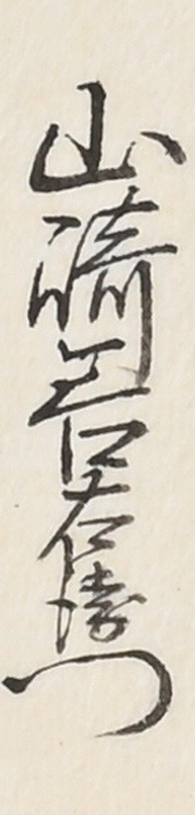山崎善右衛門
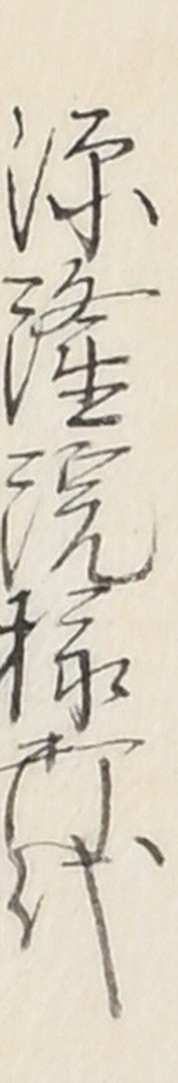源隆院様御代
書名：給人諸士勤仕録（七）
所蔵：伊那市立高遠町図書館・合同会社AMANE
